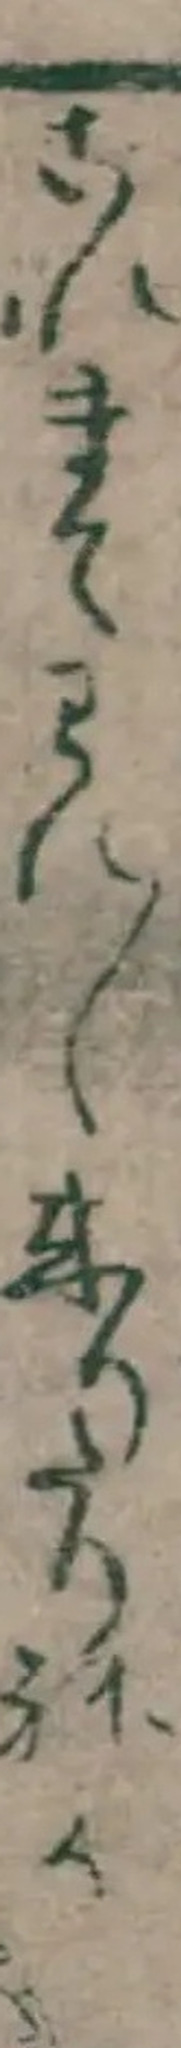これまてわれ〳〵来りたりねか
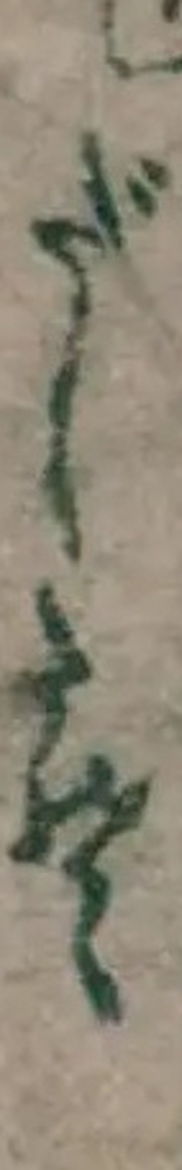だしたそ
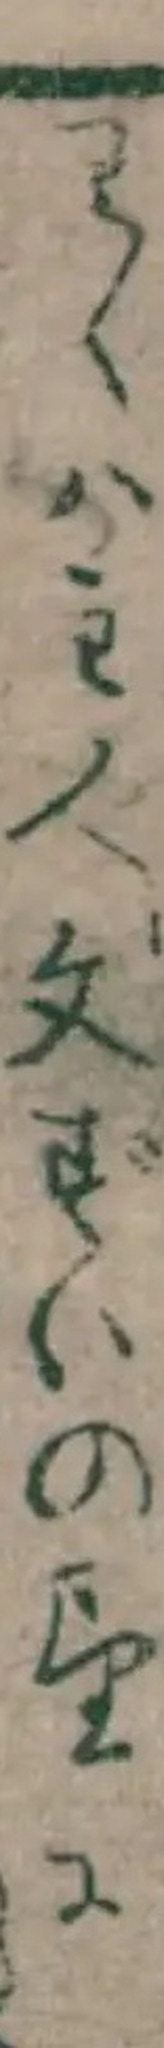わくは主人文ずいの望に
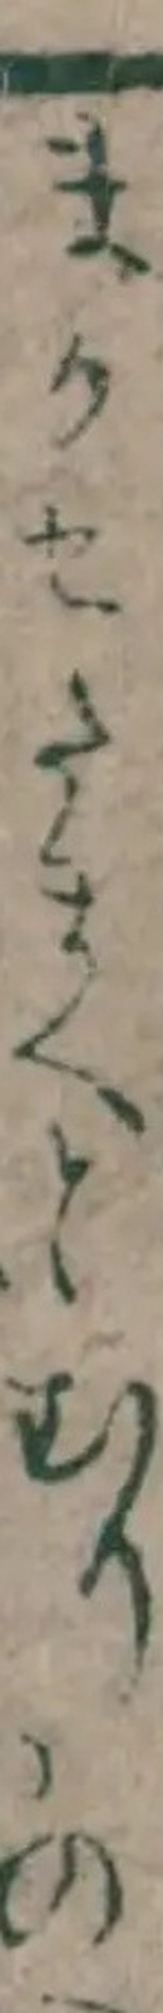まかせたまへとむりの
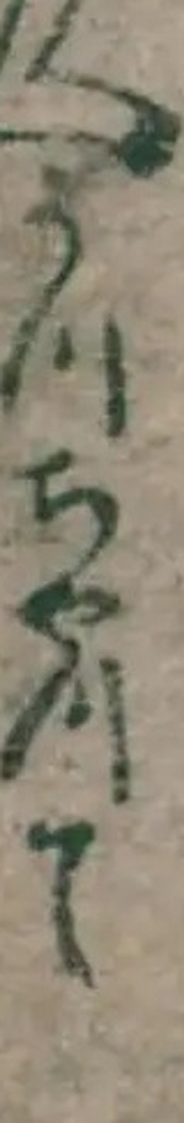うつちやつて
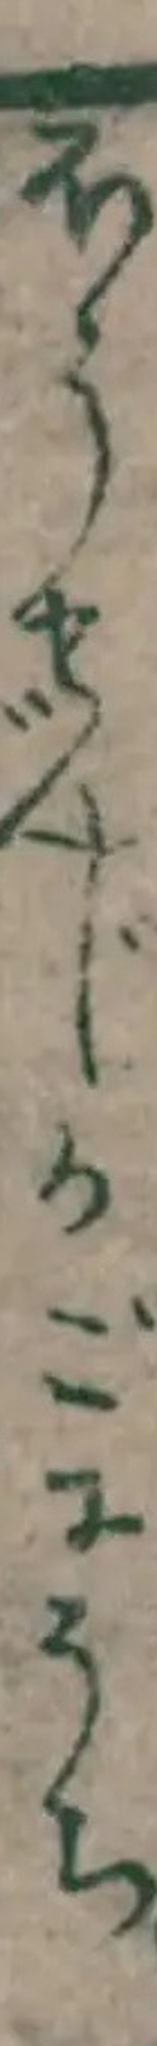ほうぜんじかごにうち
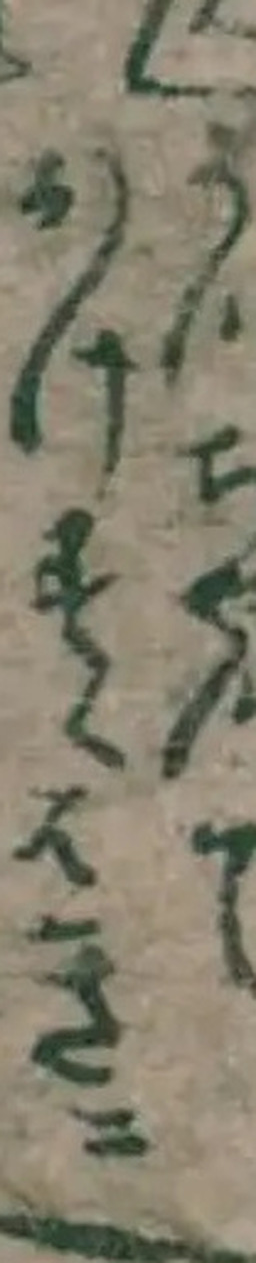おけすゝはきに
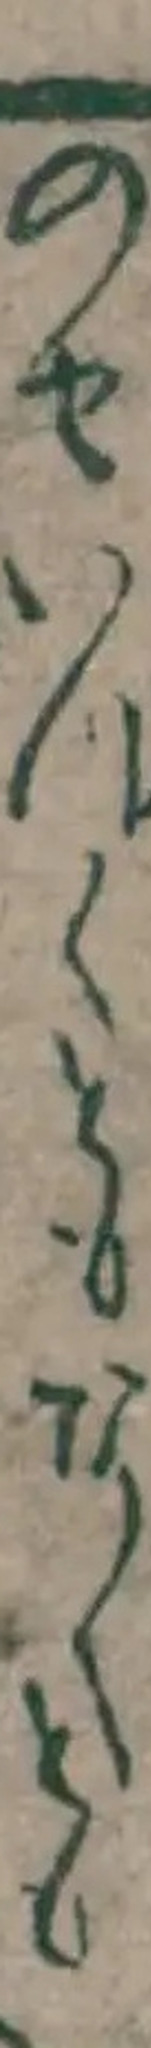のせいづくともなくとも
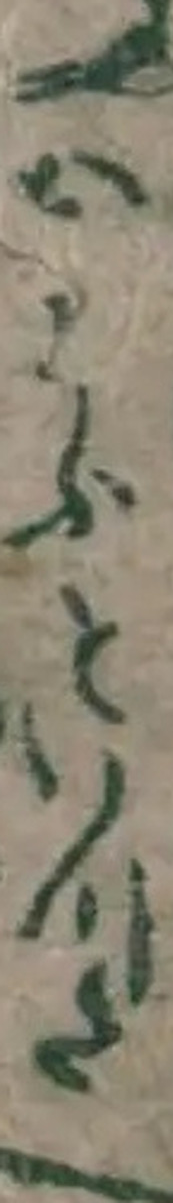およふといつた
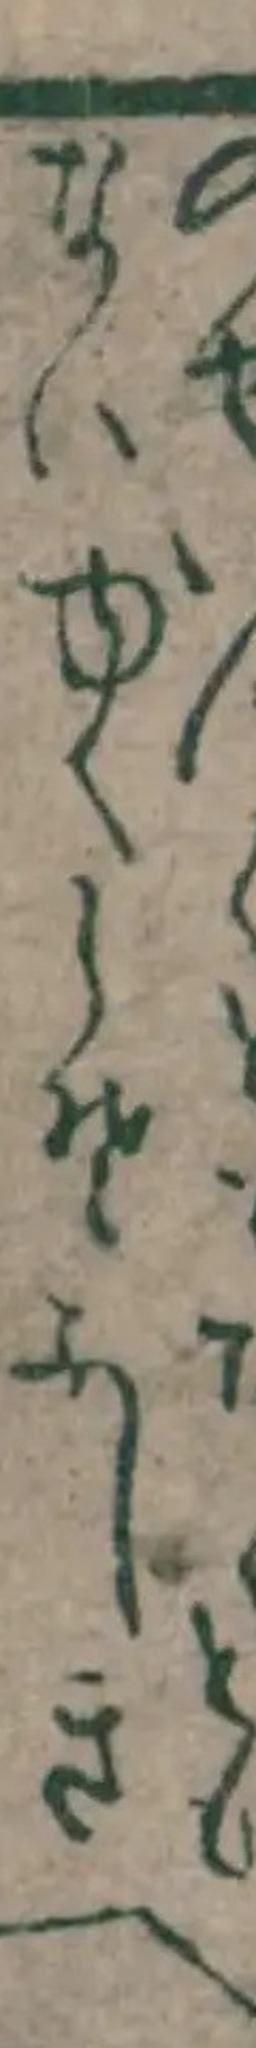ないゆくこそふしき
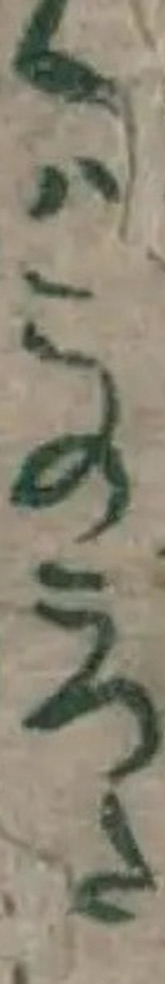はこのこつた
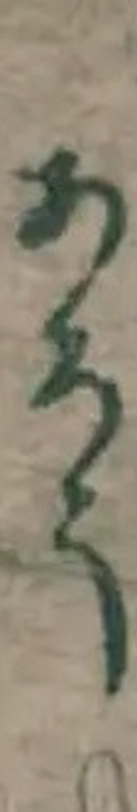あろう

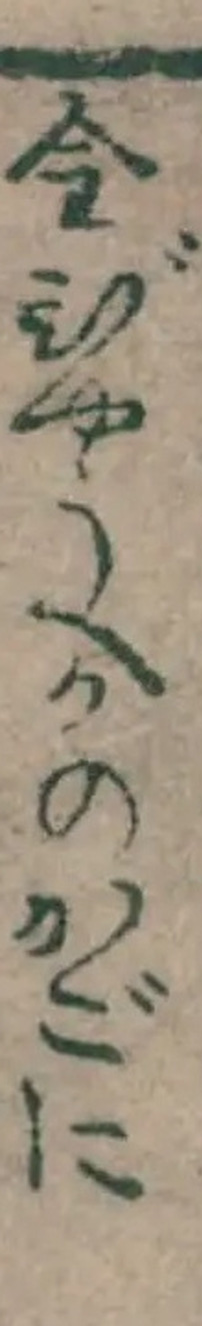金びやうへかのかごに
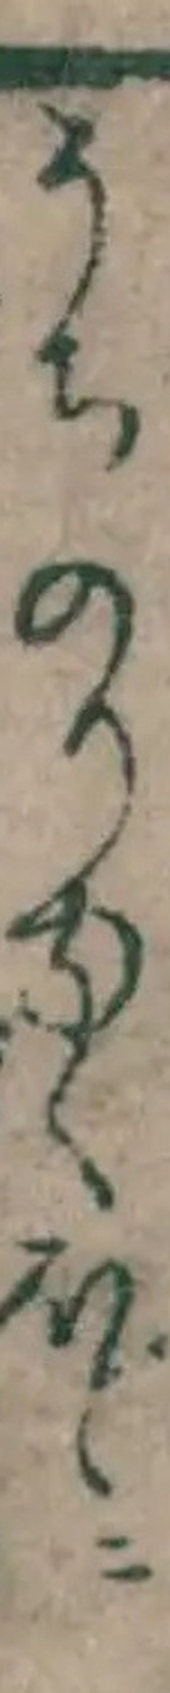うちのりゆくほどに
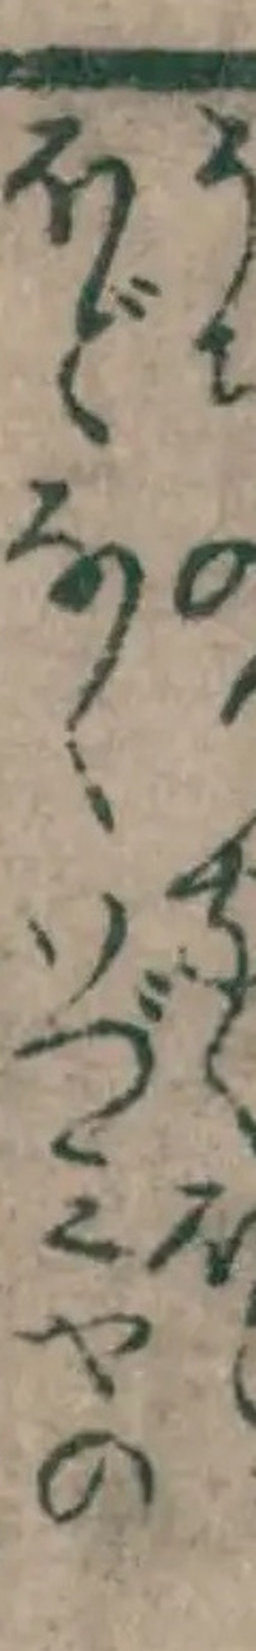ほどなくいづみやの
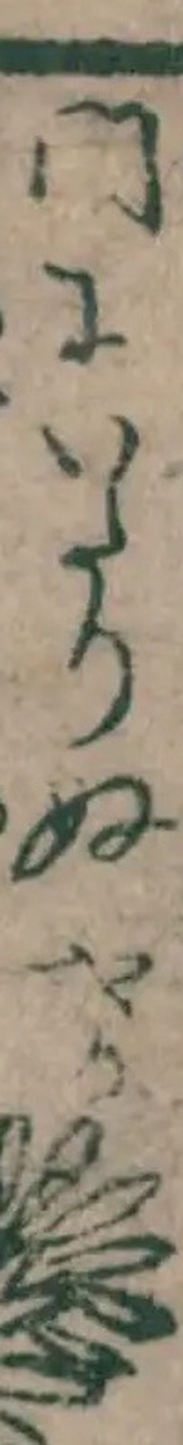門にいたりぬやりぬやか
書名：金々先生栄花夢 : 2巻
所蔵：国立国会図書館 National Diet Library, JAPAN
